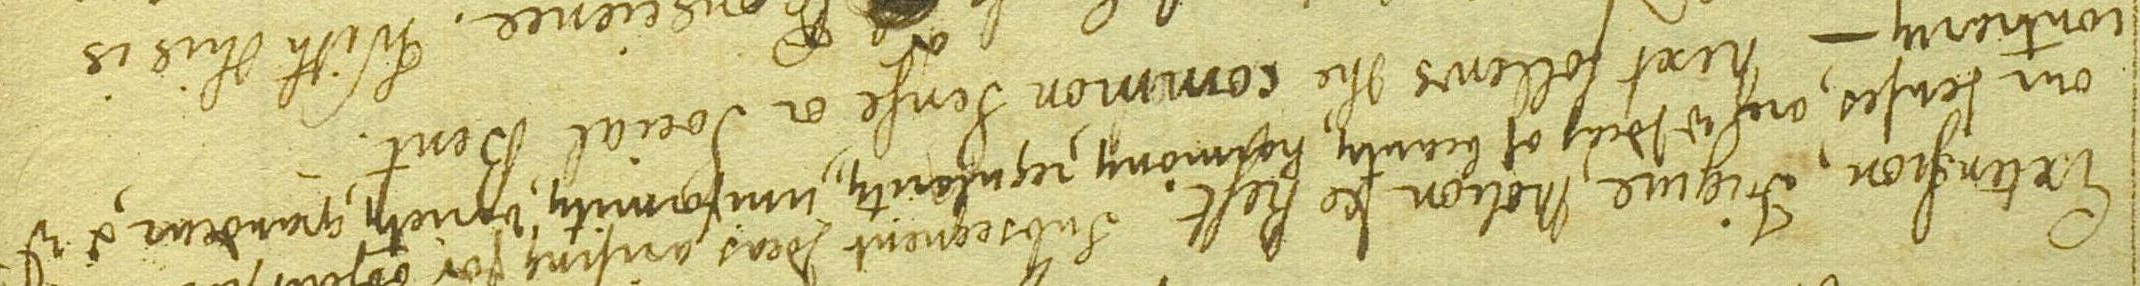our senses, are y^e Ideas of beauty, harmony, regularity, uniformity, variety, grandeur, & y^e
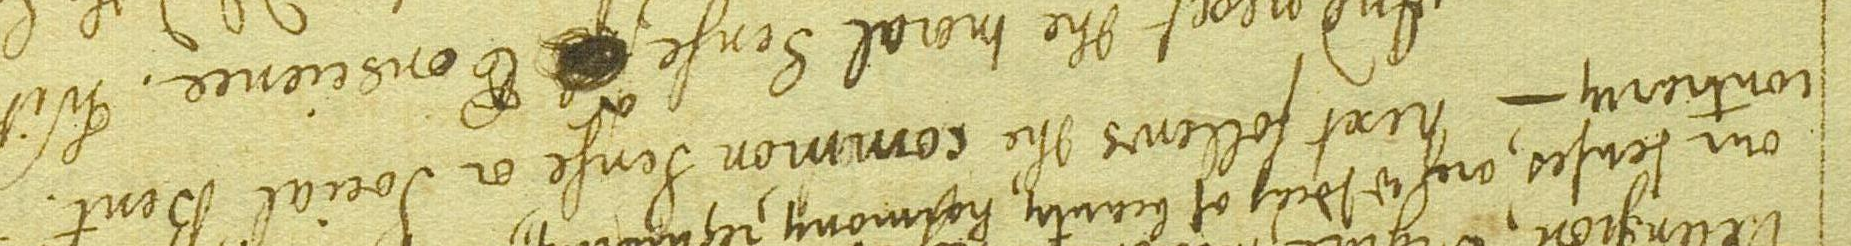contrary- Next follows the common Sense or Social Bent.
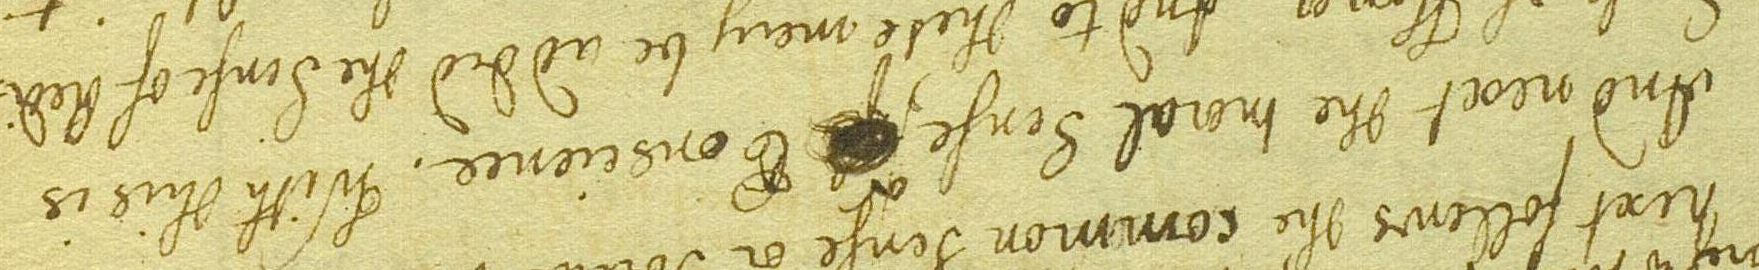And next the moral Sense ^or Conscience. With this is
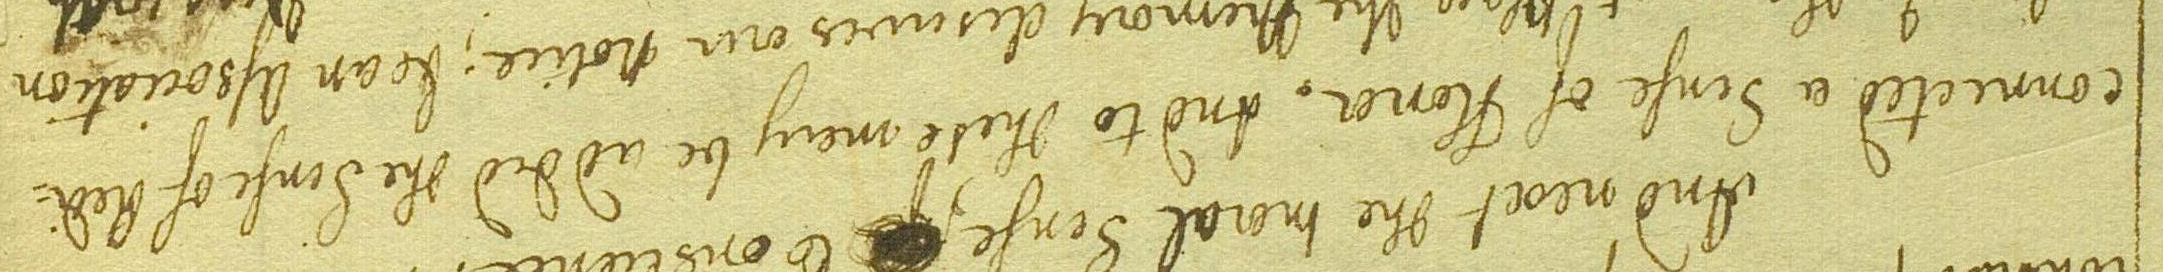connected a Sense of Honor. And to these may be added the Sense of Redi-
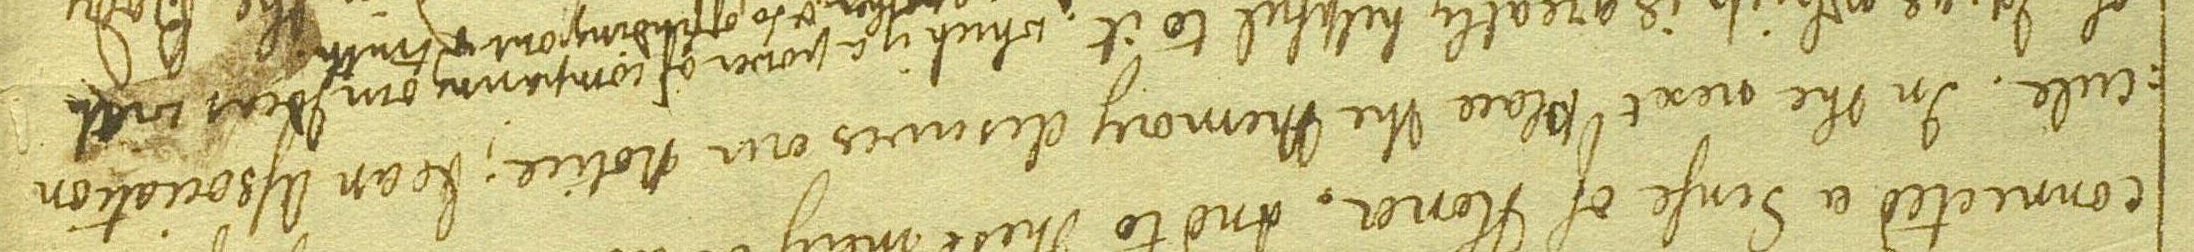-cule. In the next Place the Memory deserves our notice; & an Association
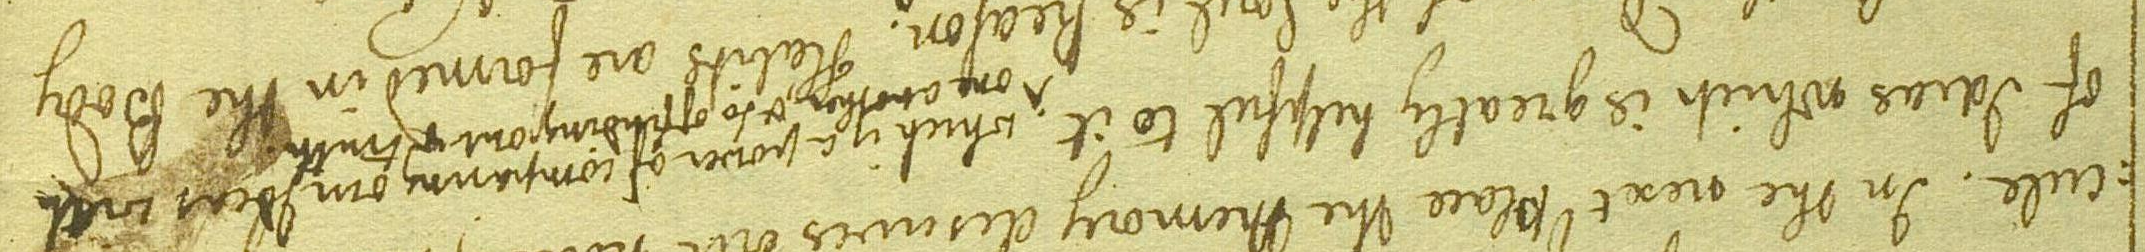of Ideas which is greatly helpful to it, which is a power of comparing our Ideas with
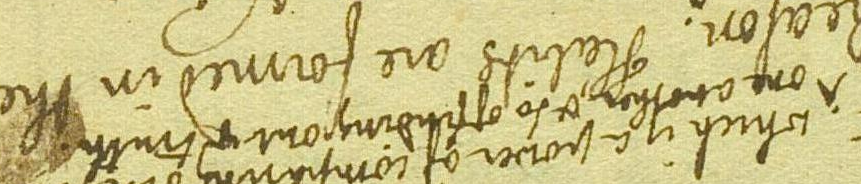^one another, & so of finding out y^e truth.
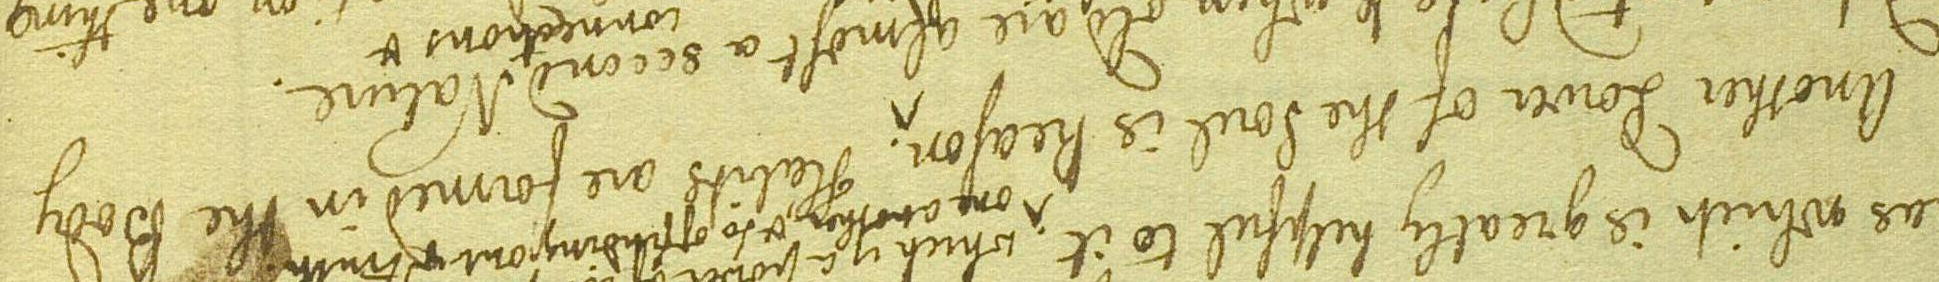Another Power of the Soul is Reason. ^ Habits are formed in the Body
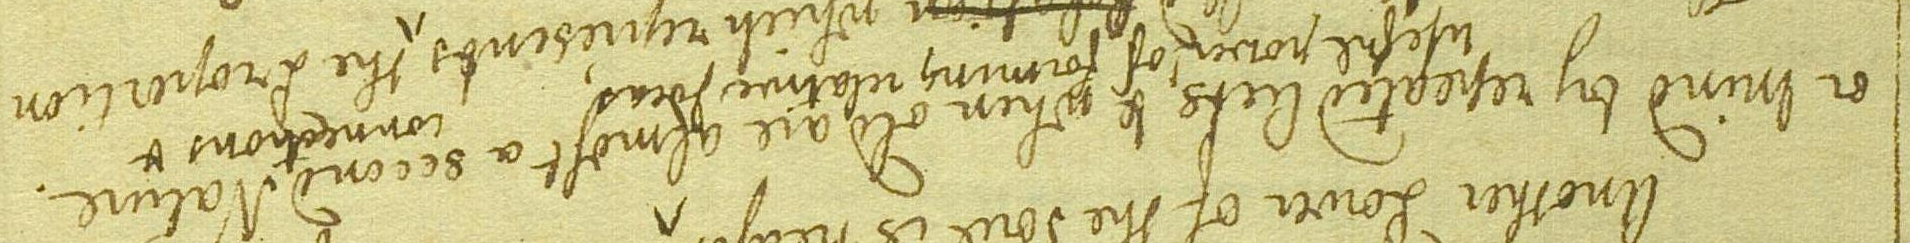or mind by repeated Acts, & when old are almost a second Nature.
